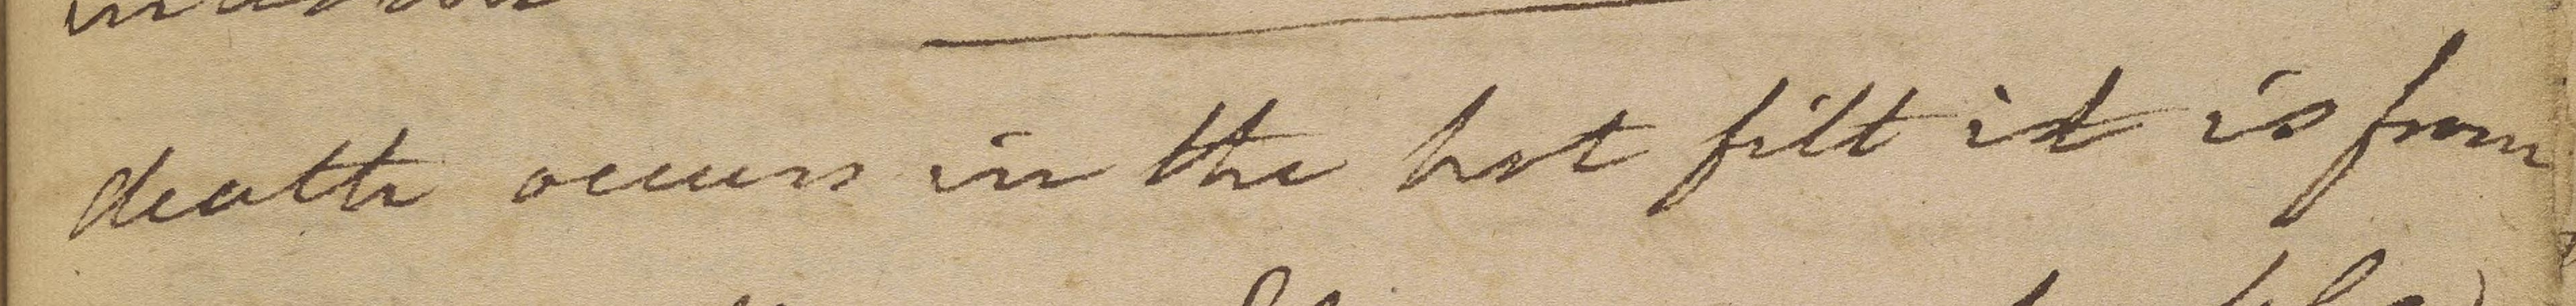death occurs in the hot fitt it is from
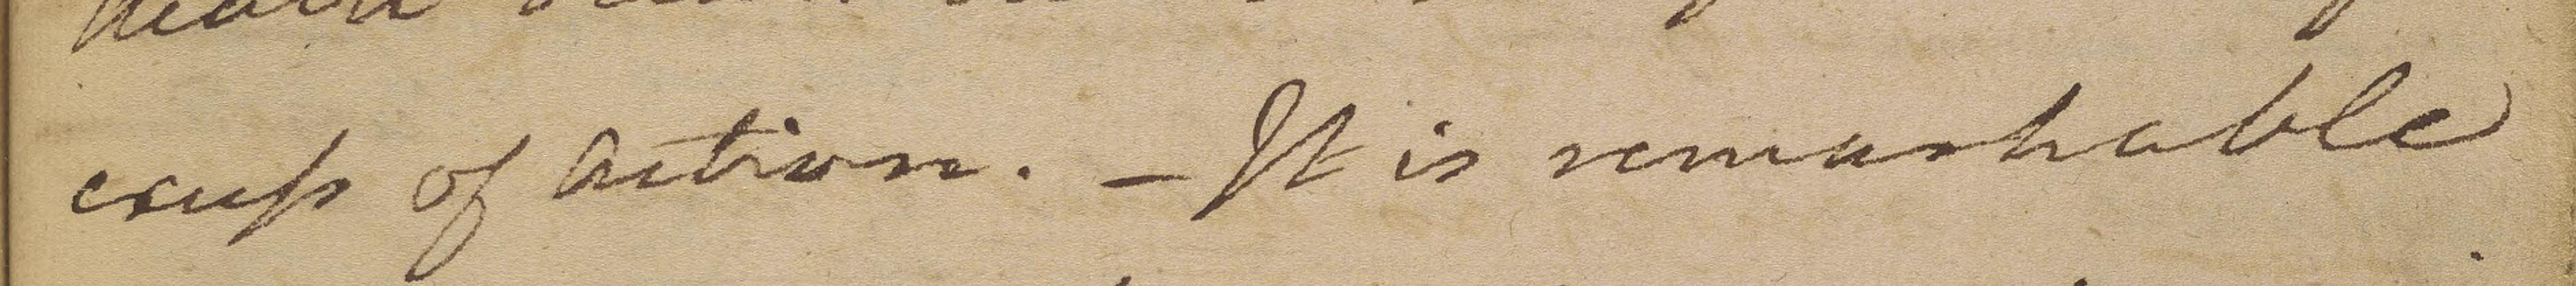excess of action.- It is remarkable
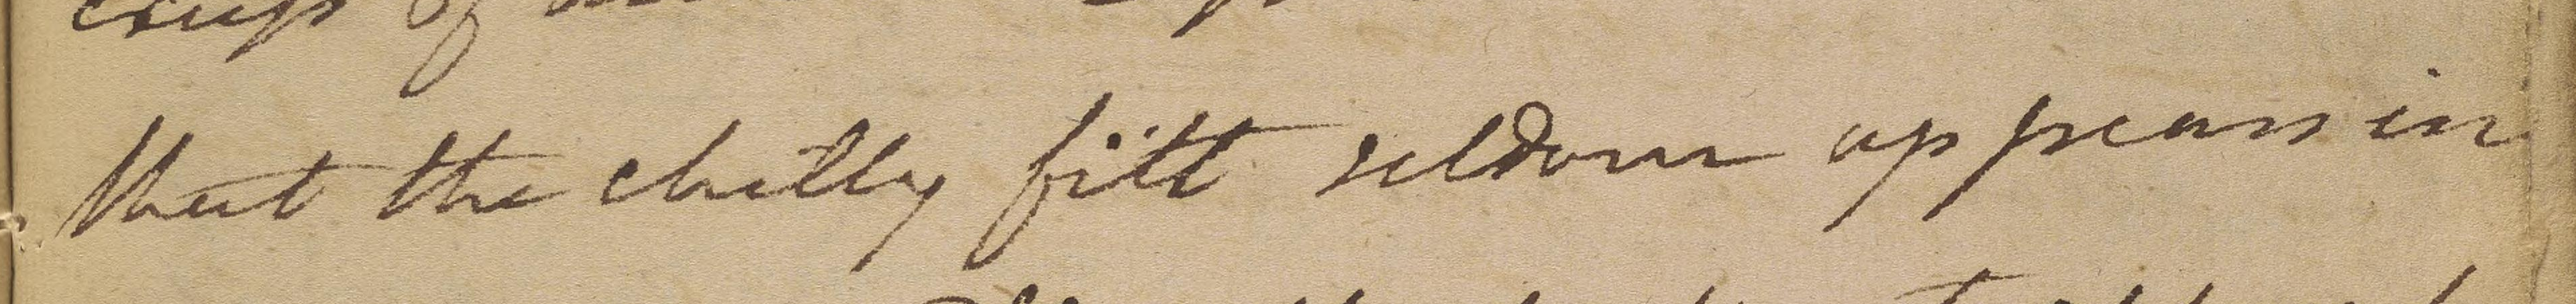that the chilly fitt seldom appears in
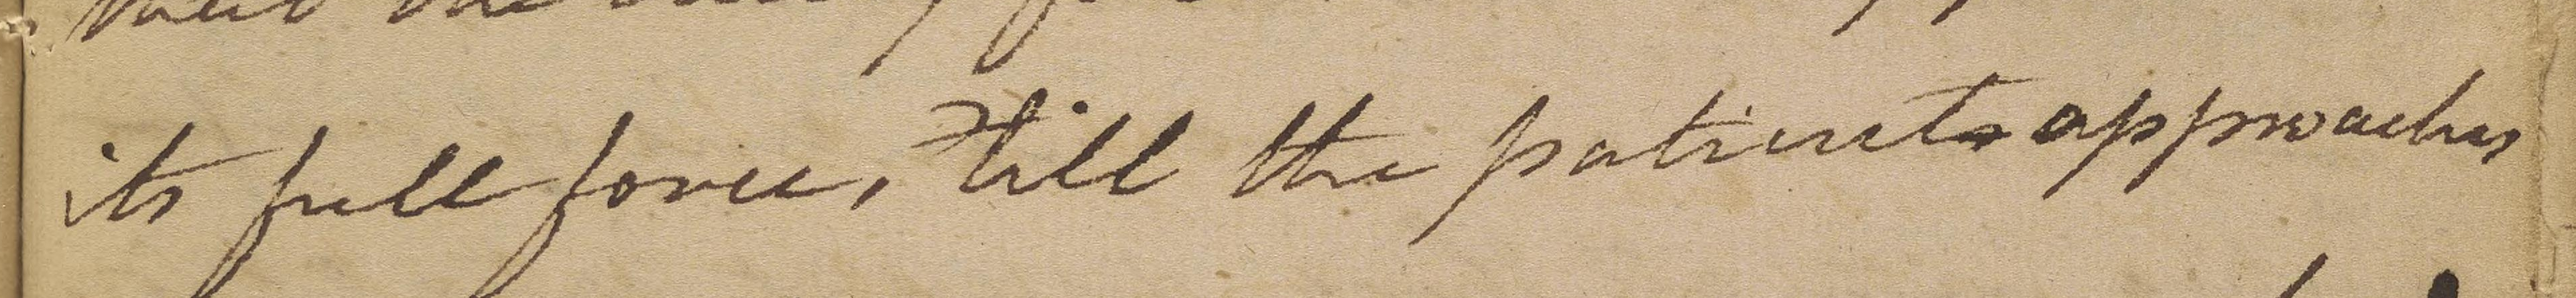its full force, 'till the patient approaches
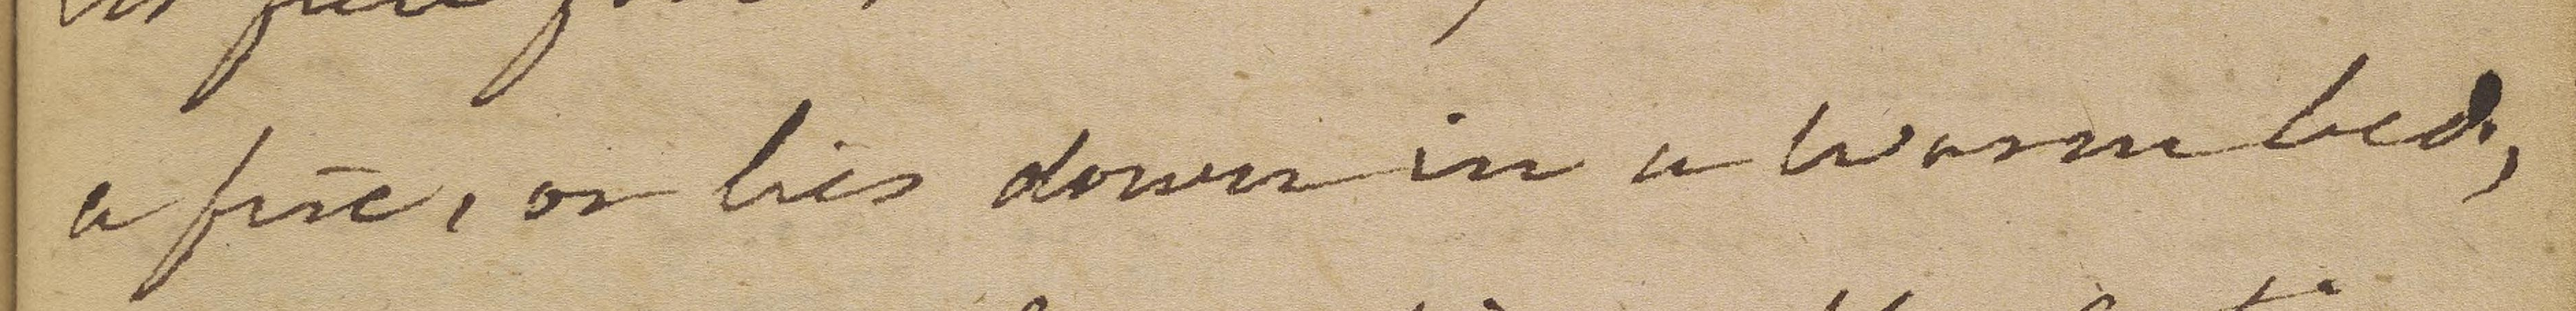a fire, or lies down in a warm bed,
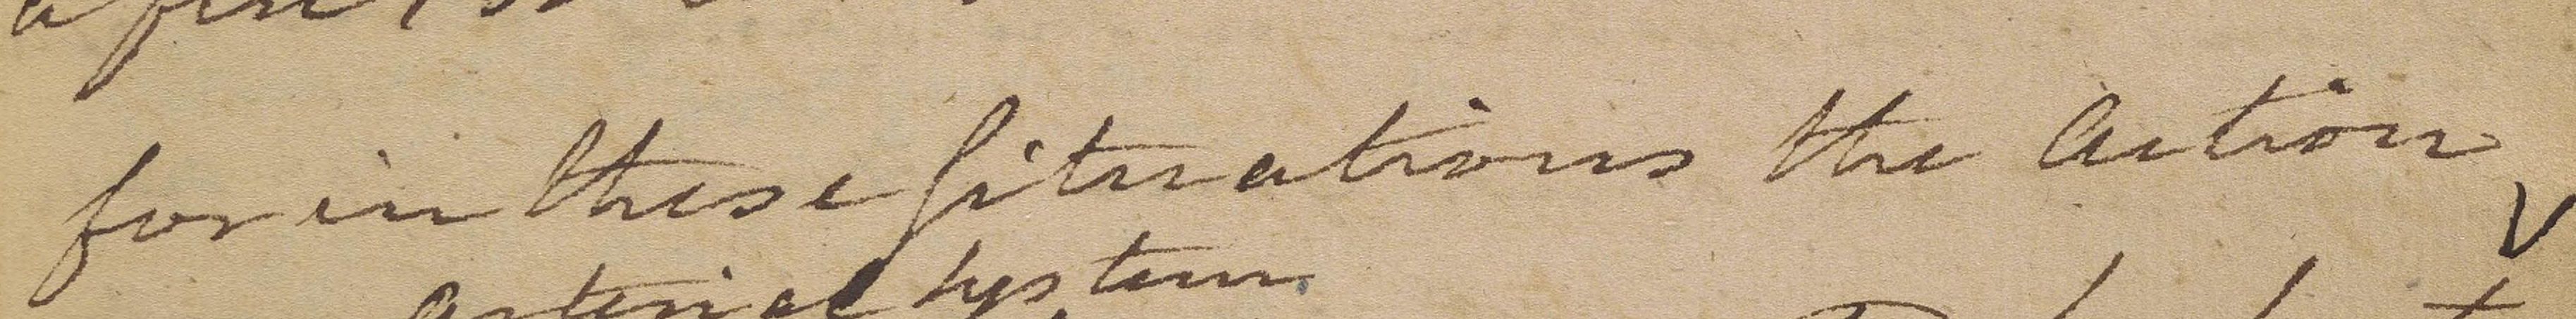for in these situations the action
